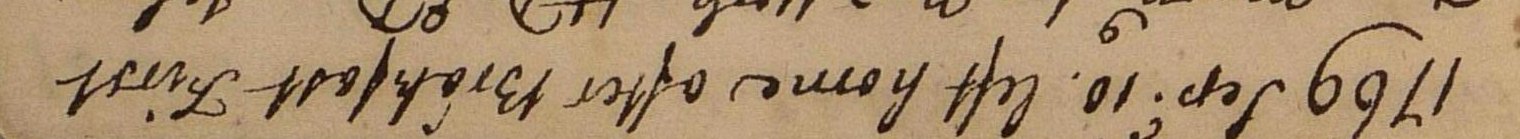1769 Sep^m. 10. left home after Brakfast First
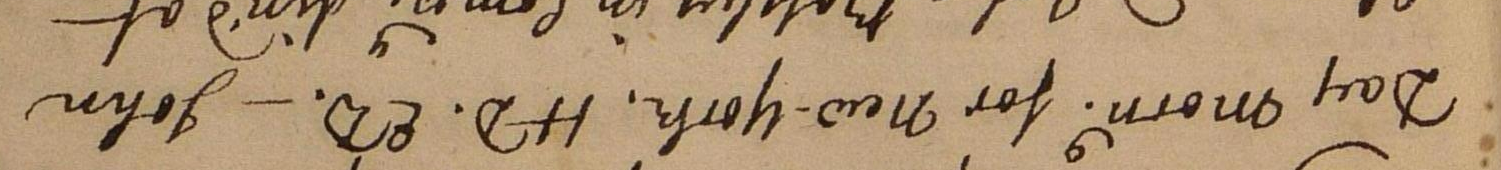Day Morn^g. for New-York. HD. ED. - John
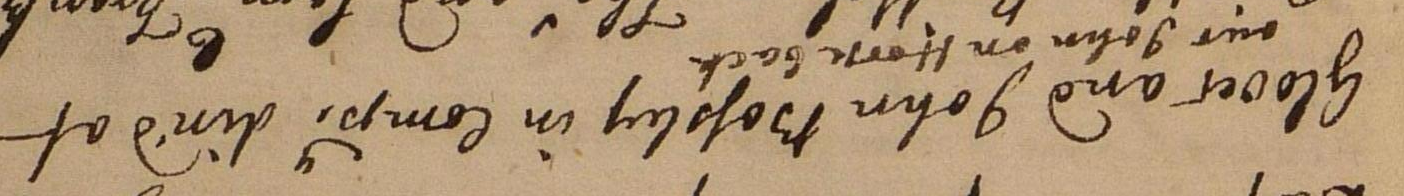Glover and John Bossley in Comp^y. din'd at
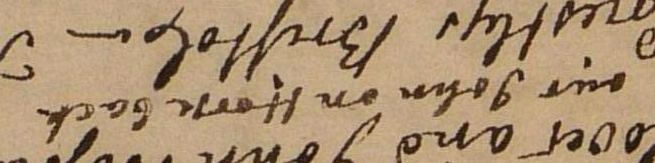our John on Horse back
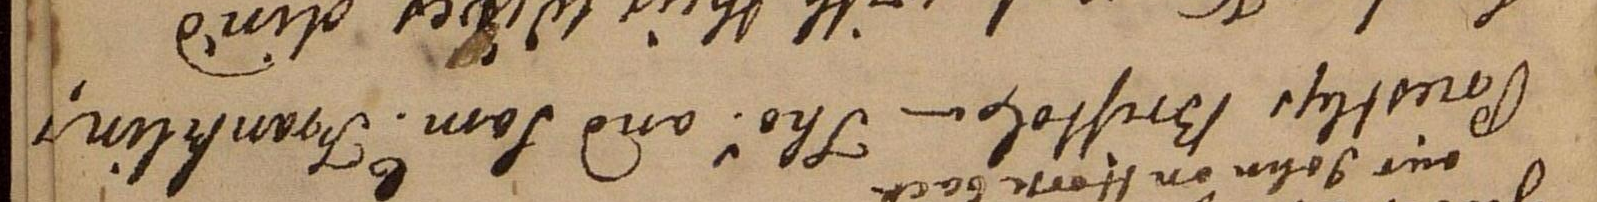Priestlys Bristol - Tho^s. and Sam^l. Franklin,
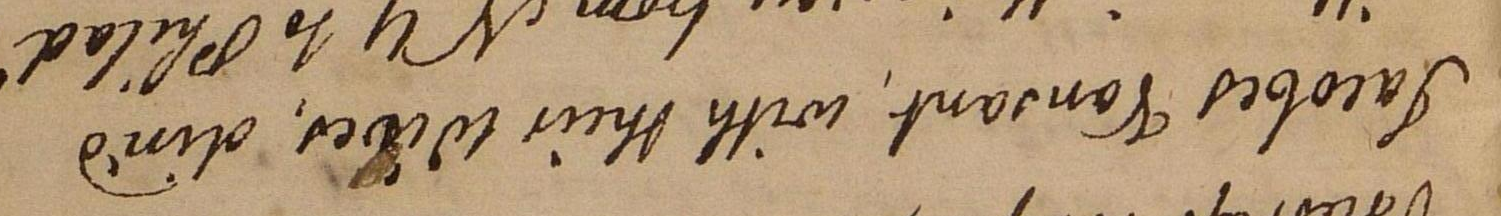Jacobes Vansant, with their Wives, din'd
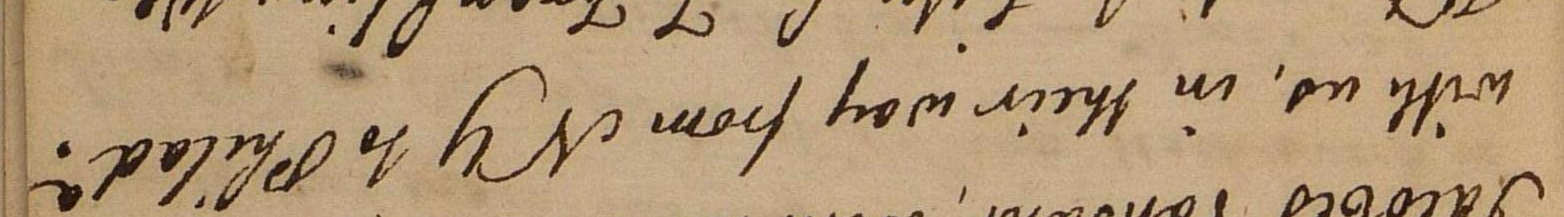with us, in their way from NY to Philad^a.
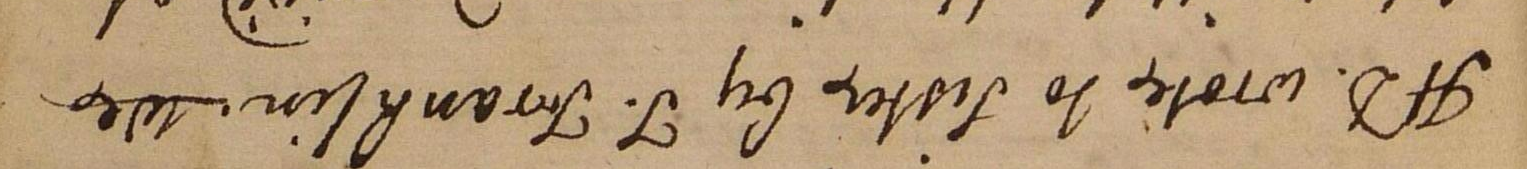HD. wrote to Sister by T. Franklin. - we
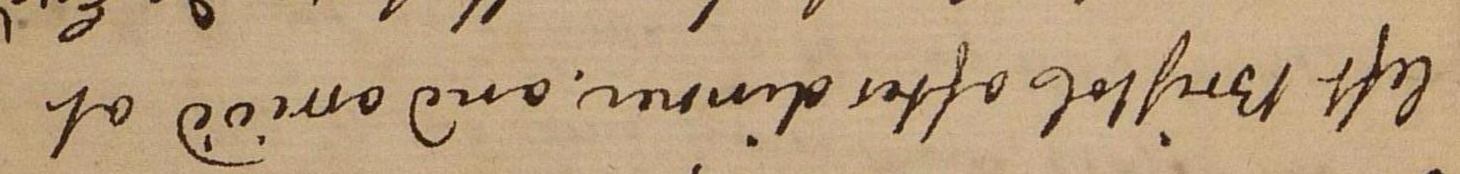left Bristol after dinner, and arriv'd at
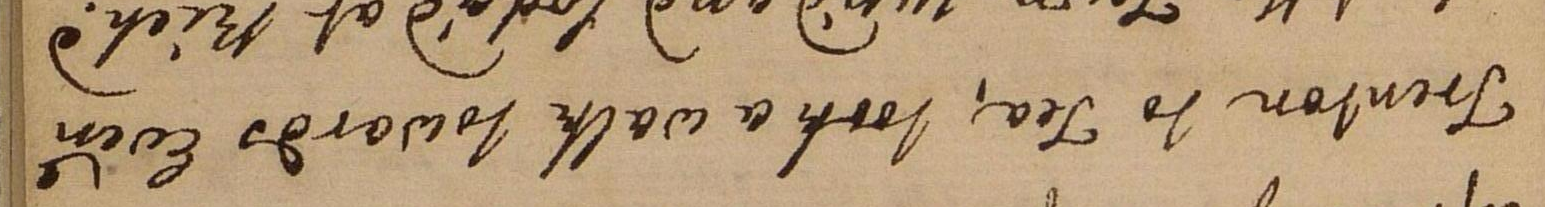Trenton to Tea, took a walk towards Even^g
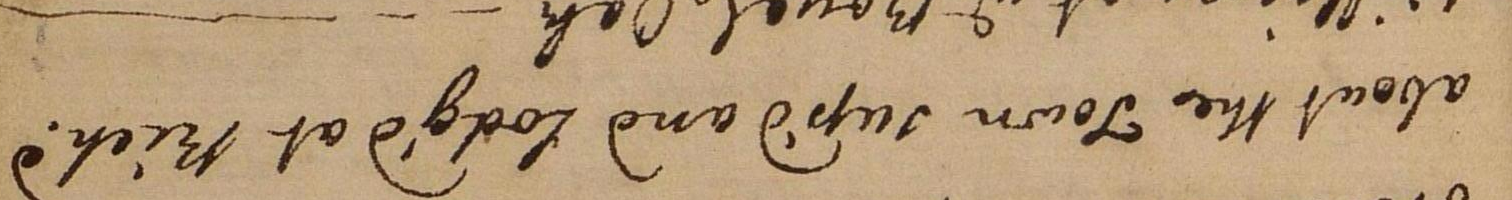about the Town sup'd and Lodg'd at Rich^d.
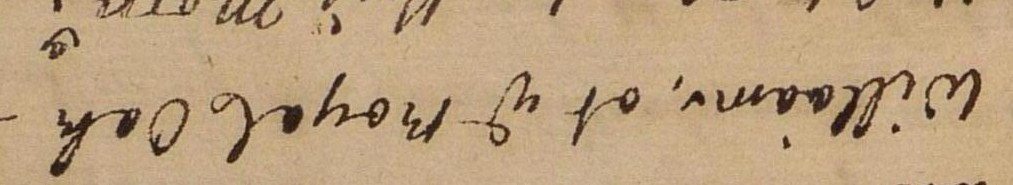Williams, at y^e Royal Oak -
